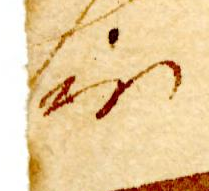Sir
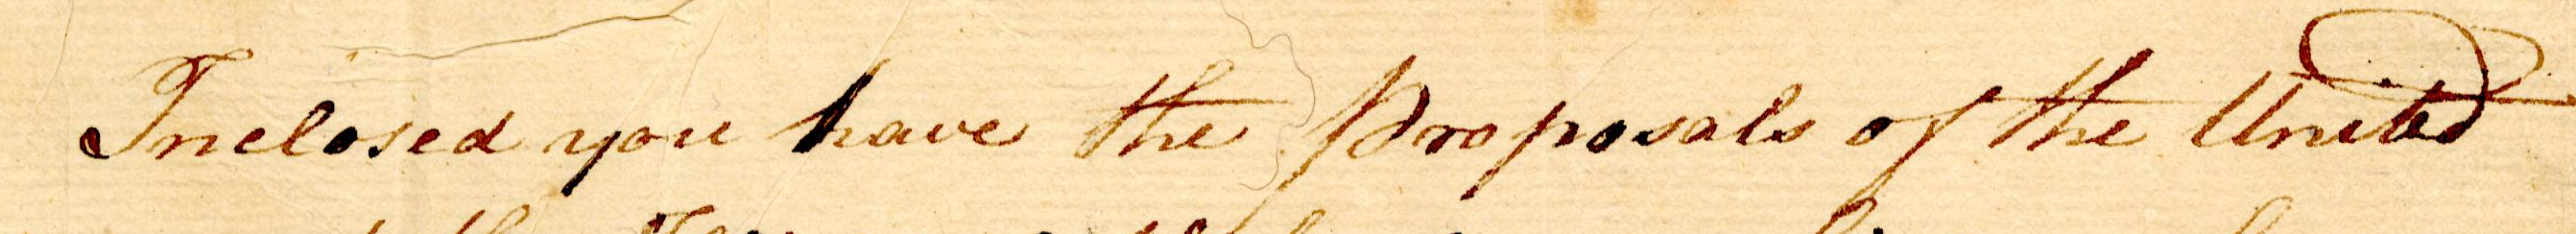Inclosed you have the proposals of the United
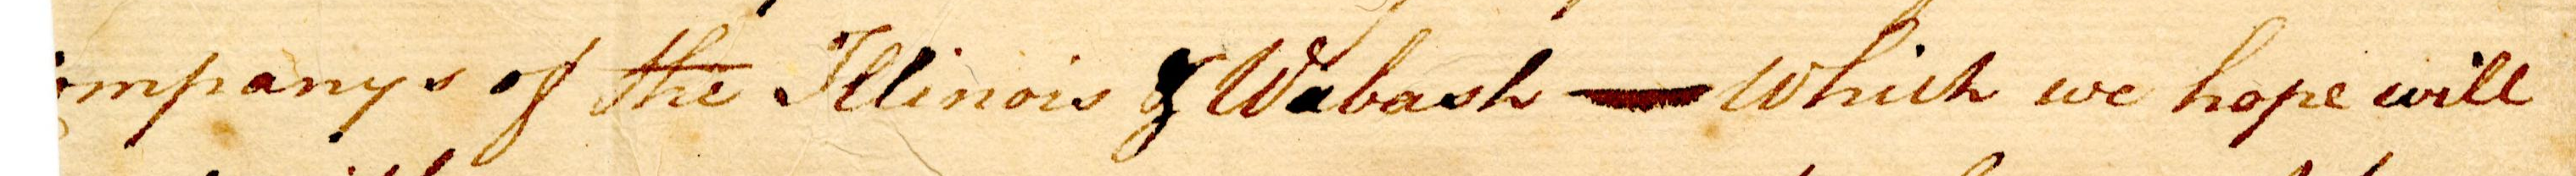mpanys of the Illinois & Wabash- Which we hope will
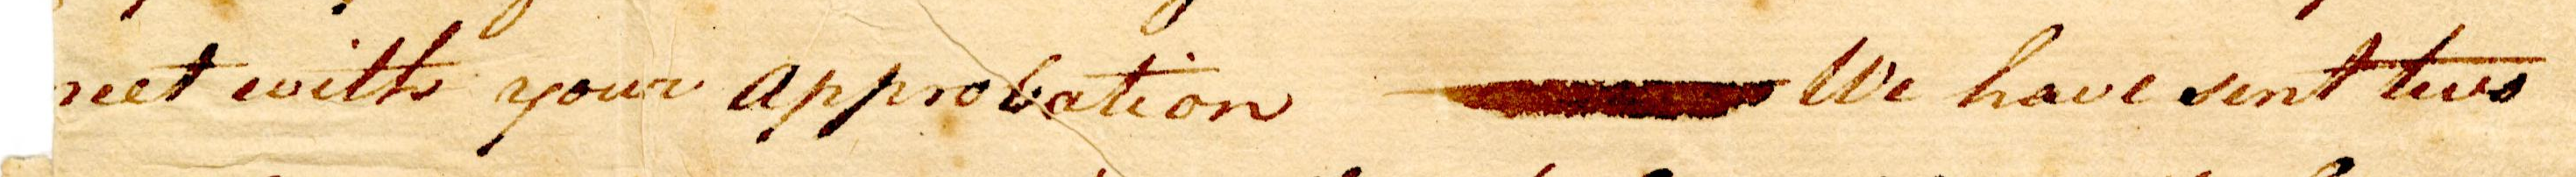meet with your approbation- We have sent two
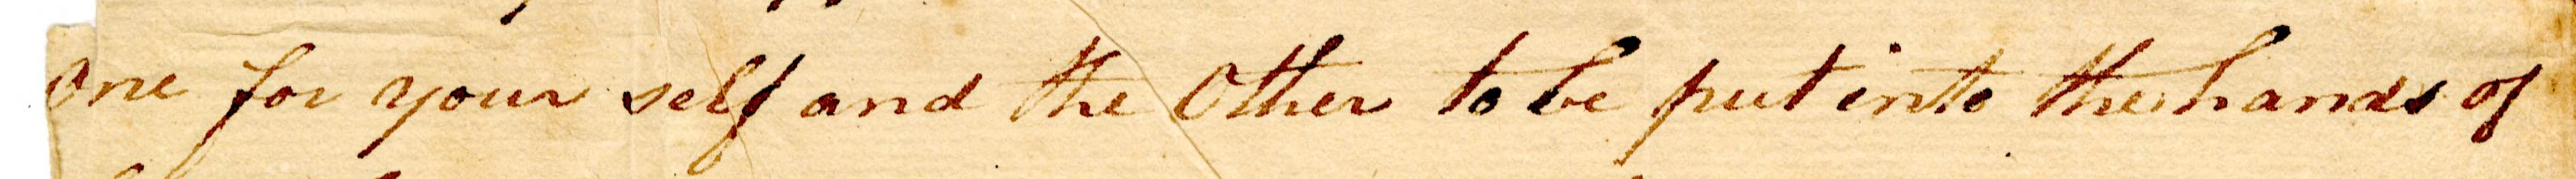one for your self and the other to be put into the hands of
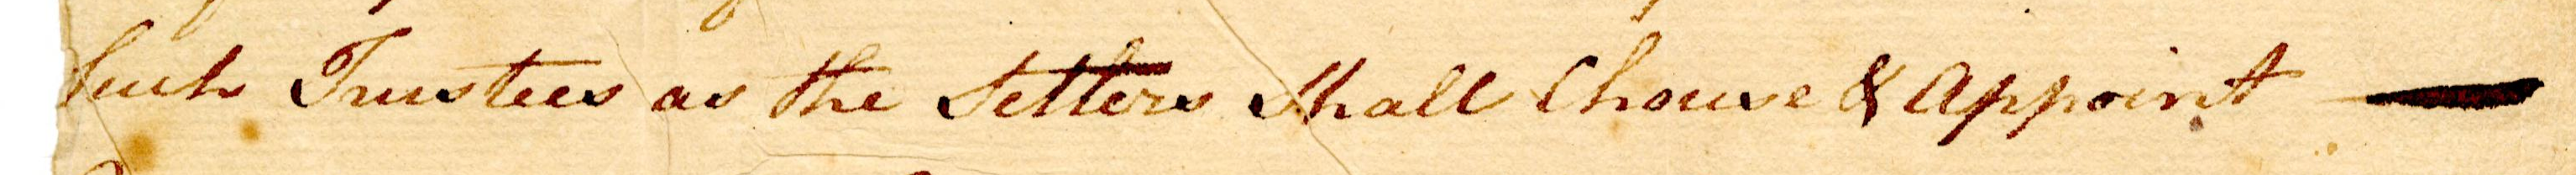Such Trustees as the Setlers shall Chouse & Appoint.-
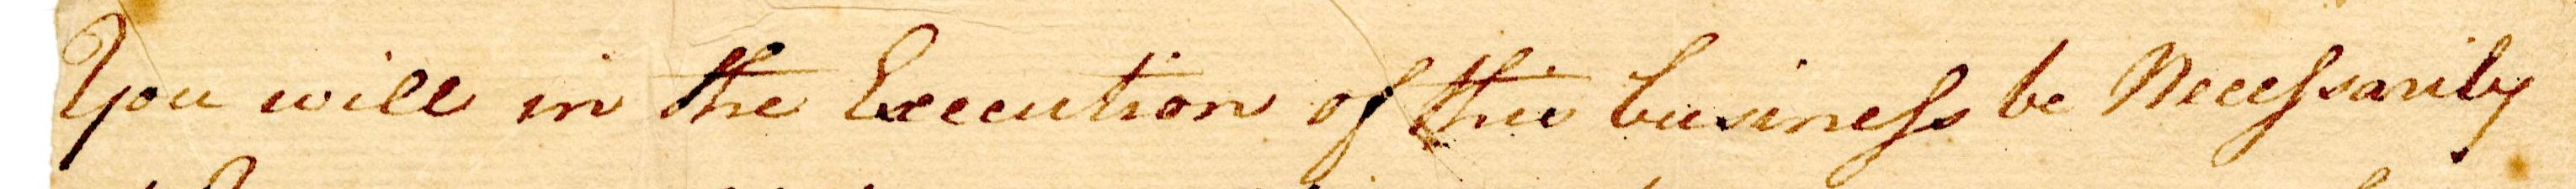You will in the Execution of this business be necessarily
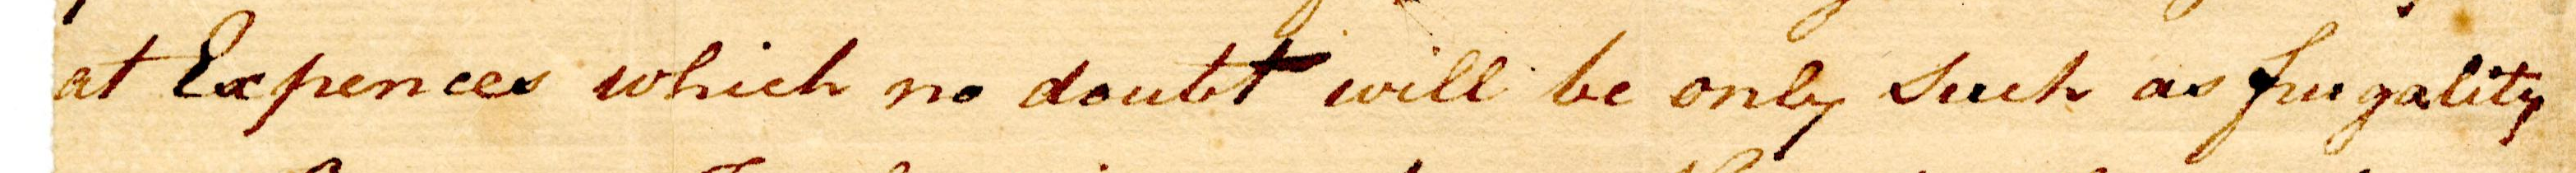at Expences which no doubt will be only such as frugality
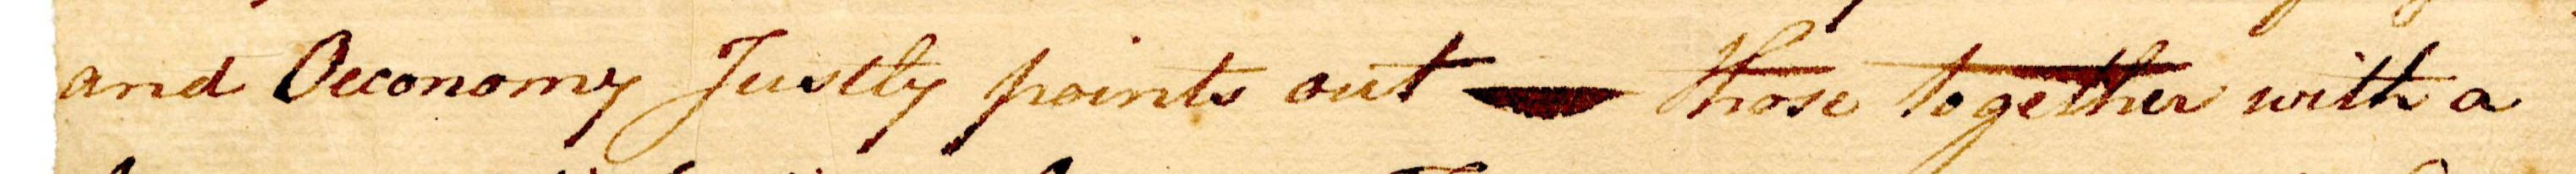and Oeconomy Justly points out- those together with a
